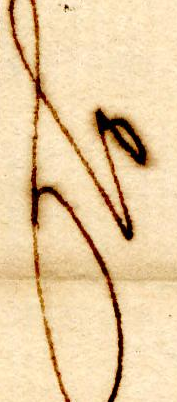To
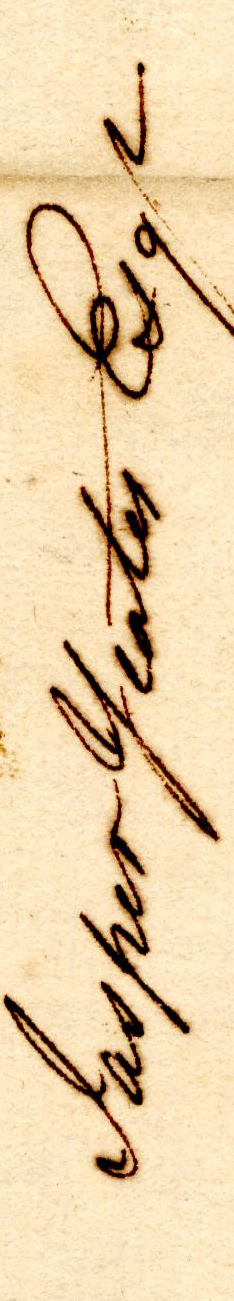Jasper Yeates Esq^r
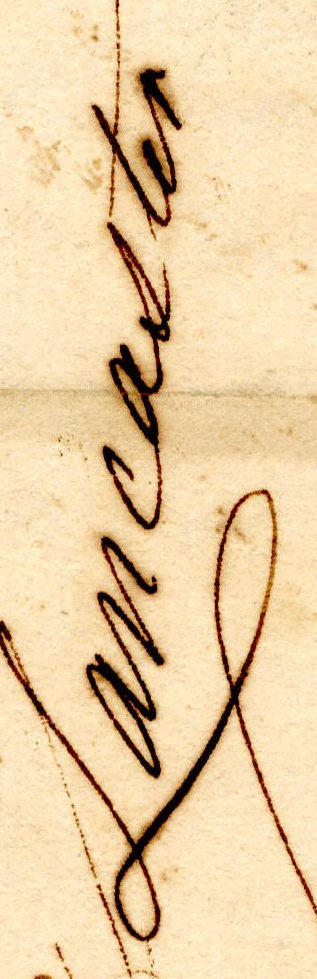Lancaster
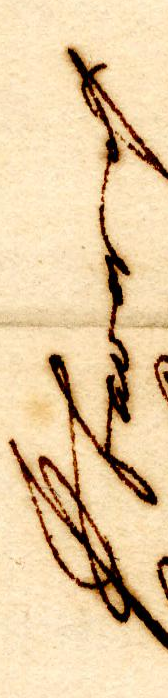per favor of
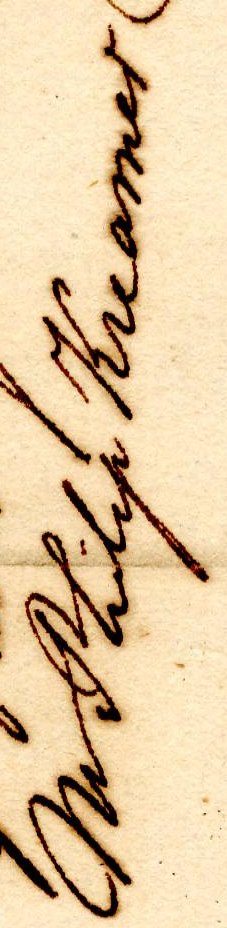M^r Philip Kreamer
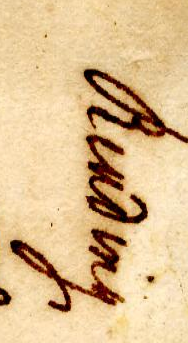Reading
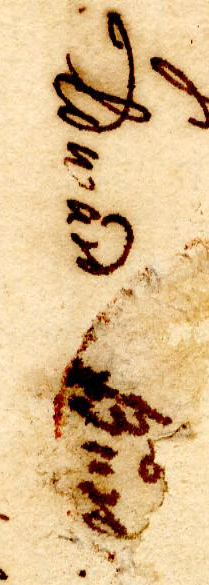Edward Bird
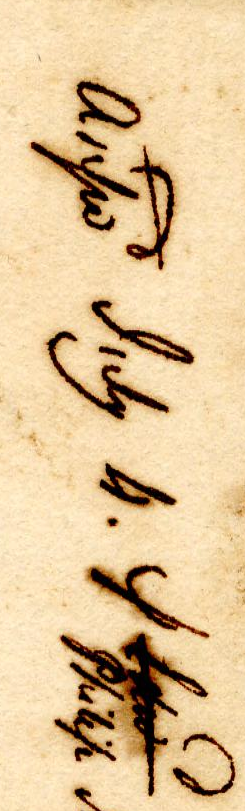Answ^d July 4. 1 Edw^d
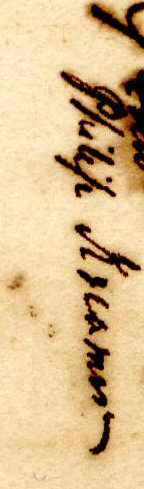Philip Kreamer
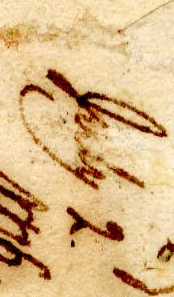July 2^d
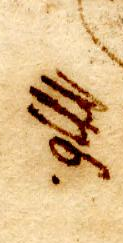1776.
